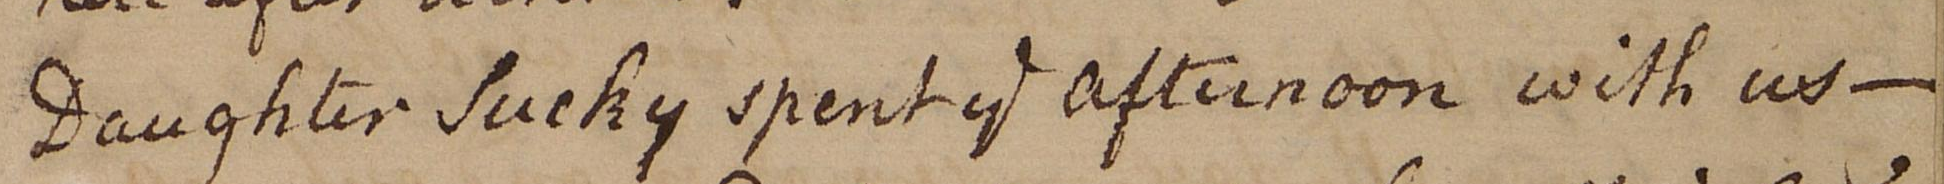Daughter Sucky spent y^e afternoon with us-
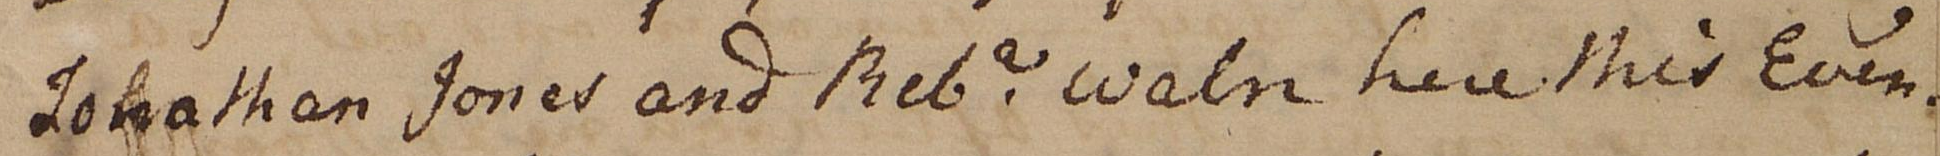Jonathan Jones and Reb^a. Waln here this Even^g.
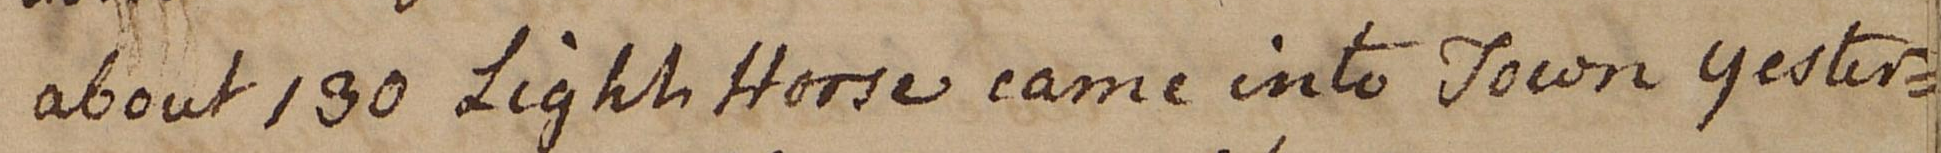about 130 Light Horse came into Town yester-
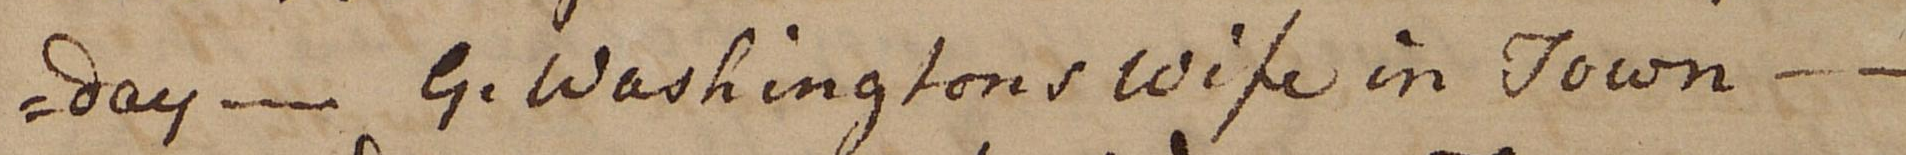-day- G. Washingtons Wife in Town-
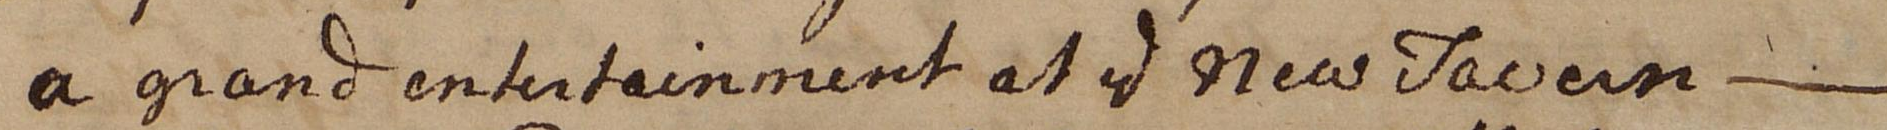a grand entertainment at y^e New Tavern-
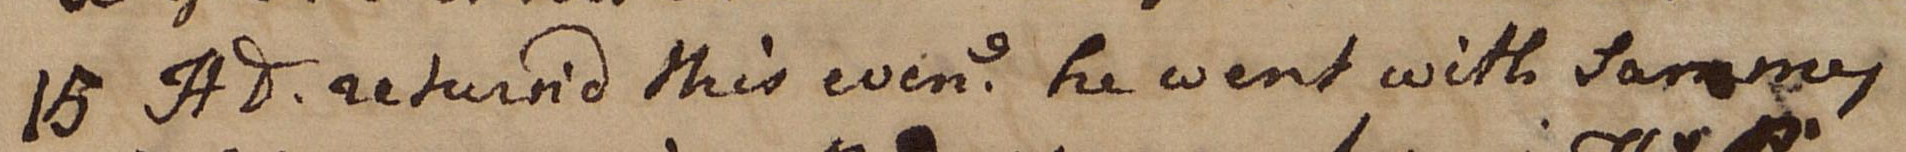15 HD. return'd this even^g. he went with Sammy
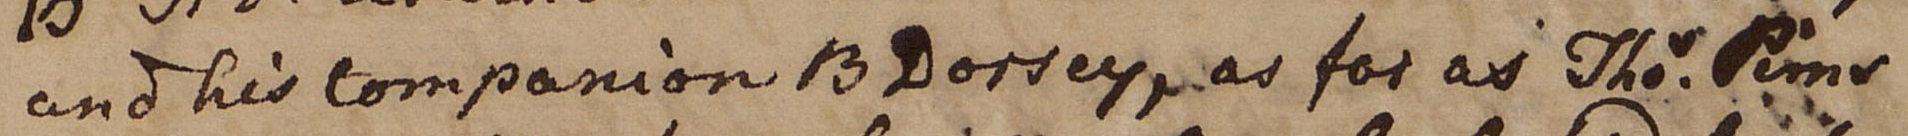and his companion B Dorsey, as for as Tho^s. Pims
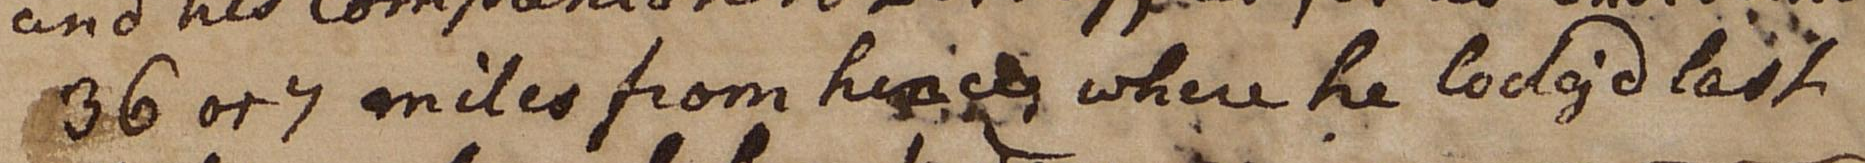36 or 7 miles from hence, where he lodg'd last
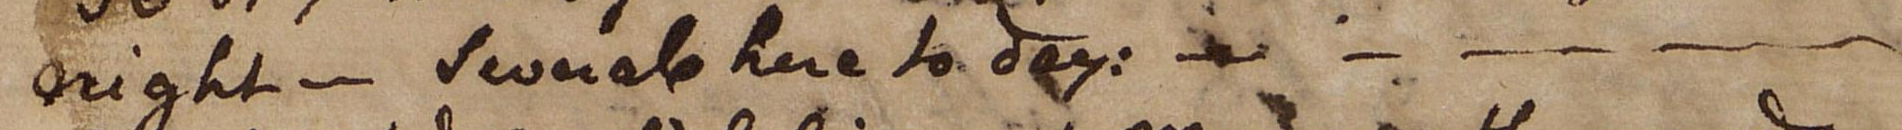night- several here to day:-
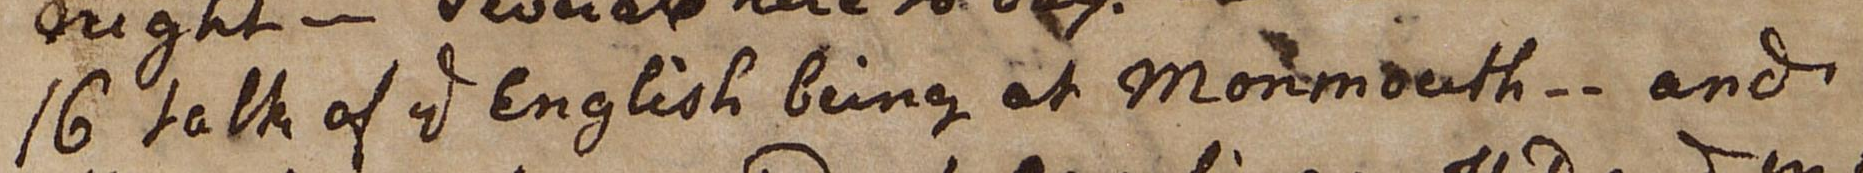16 talk of y^e English being at Monmouth- and
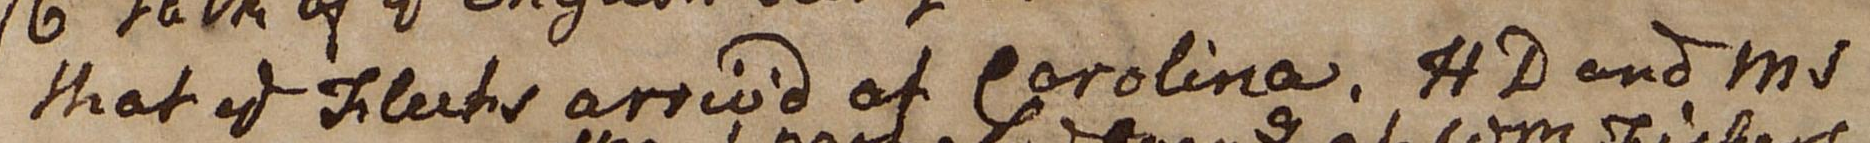that y^e Fleets arriv'd of Carolina. HD and MS
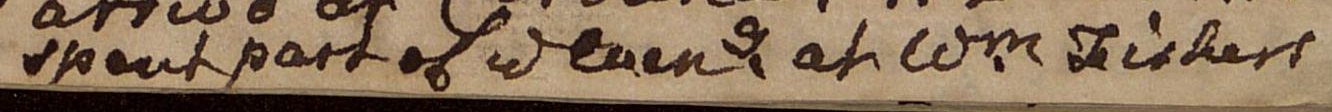spent part of y^e Even^g. at W^m. Fishers
